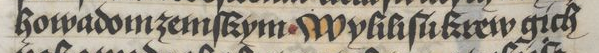howadom zemſkym.Wyliliſu krew gich
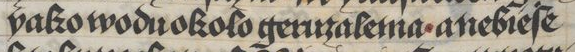yako wodu okolo geruzalema.anebieẛe
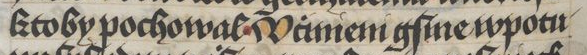ktoby pochowal.Vċineni gſme wpotu¬
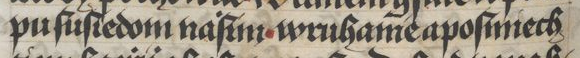pu ſuſiedom naẛim.wruhanie a poſmiech
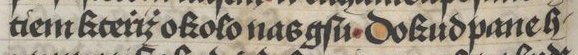tiem kteṙíż okolo nas gſu.Dokú pane h¬
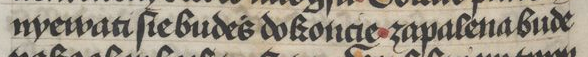nyewati ſie budeṡ dokoncie.zapalena bude
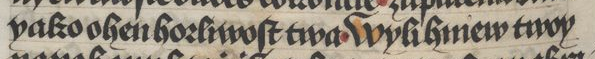yako ohen horliwoſt twa.Wyli hniew twoy
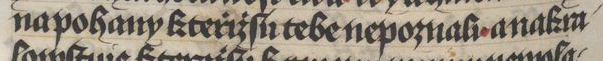na pohany kteṙiżſu tebe nepoznali.anakra¬
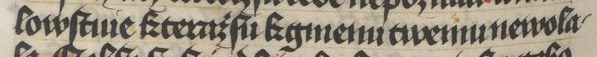lowſtuie kterażſu kgmenu twemu newola¬
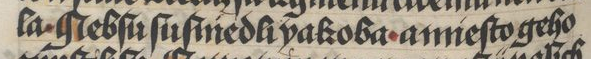la.Nebſu ſu ſniedli yakoba.a mieſto geho
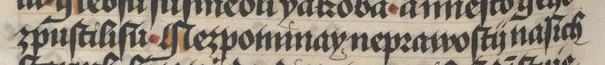zpuſtiliſu.Nezpominay nieprawoſti naẛich
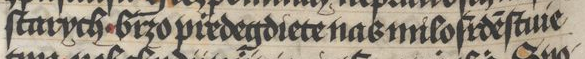starych.brzo pṙedegdiete nas miloſrdēſtuie
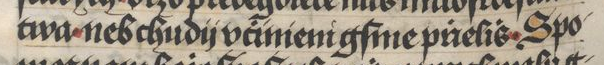twa.neb chudij vċinieni gſme pṙieliš.Spo¬
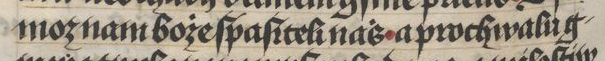mnoz nam boże ſpaſiteli nas.a prochwalu g¬
